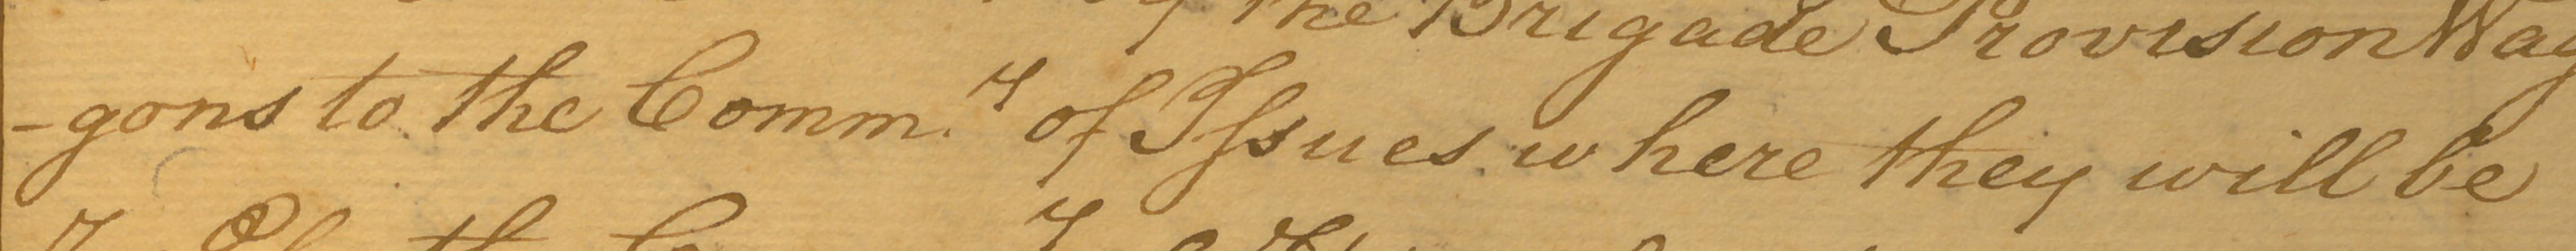-gons to the Comm^r. of Issues where they will be
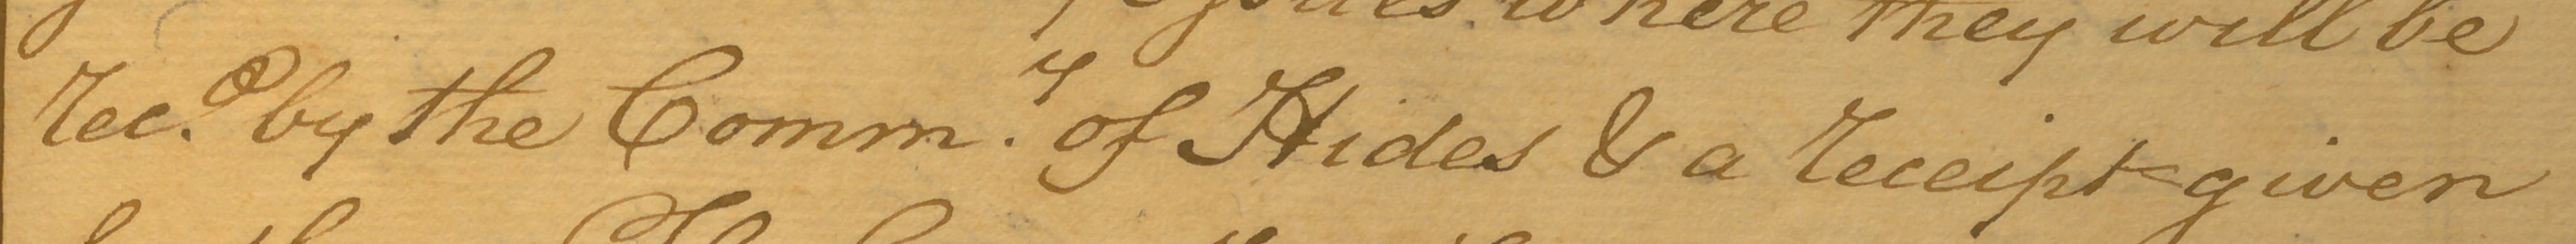rec^d. by the Comm^y. of Hides & a receipt given
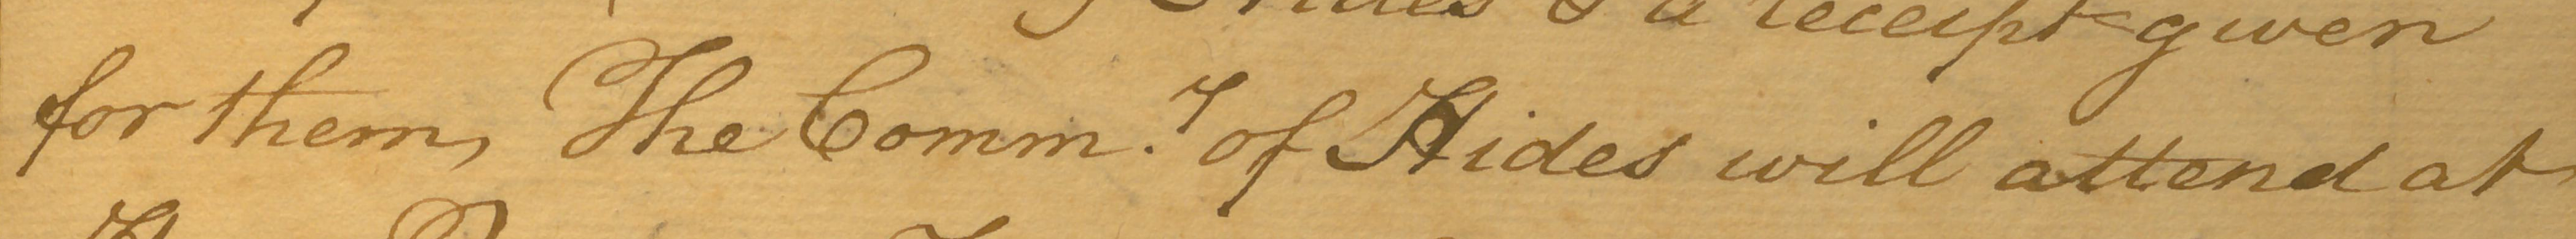for them, The Comm^y. of Hides will attend at
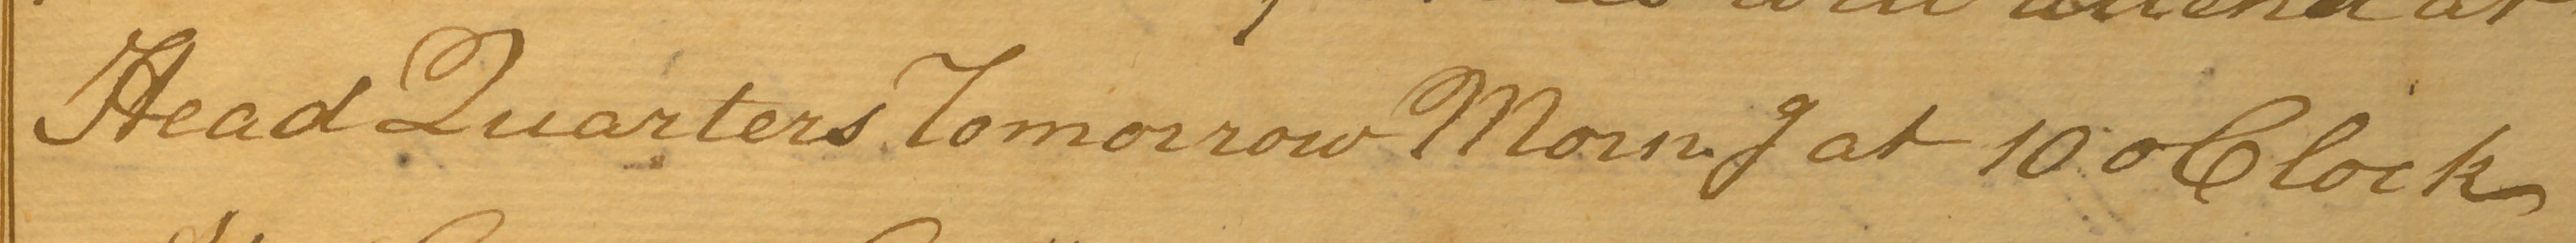Head Quarters Tomorrow Morn^g. at 10 oClock
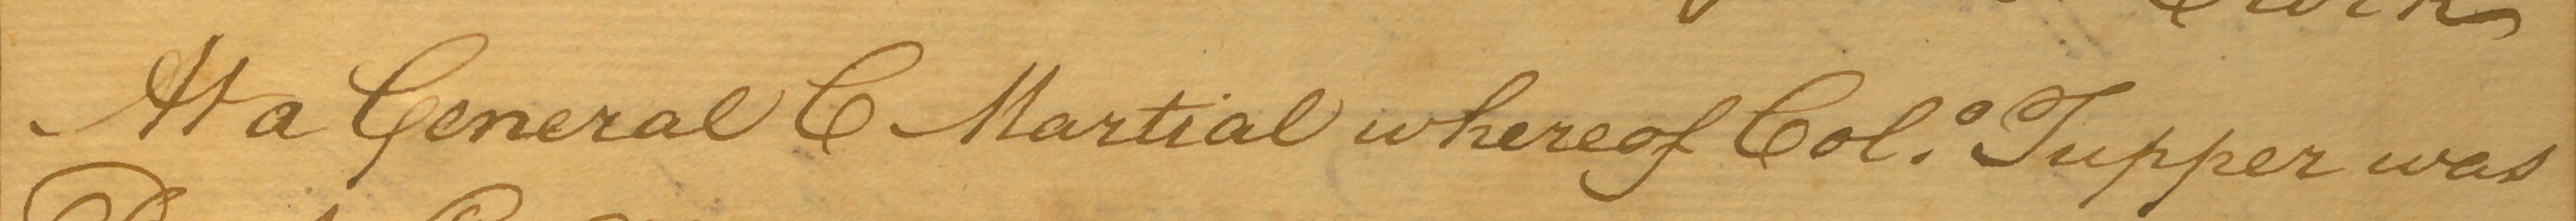At a General C Martial whereof Col^o. Tupper was
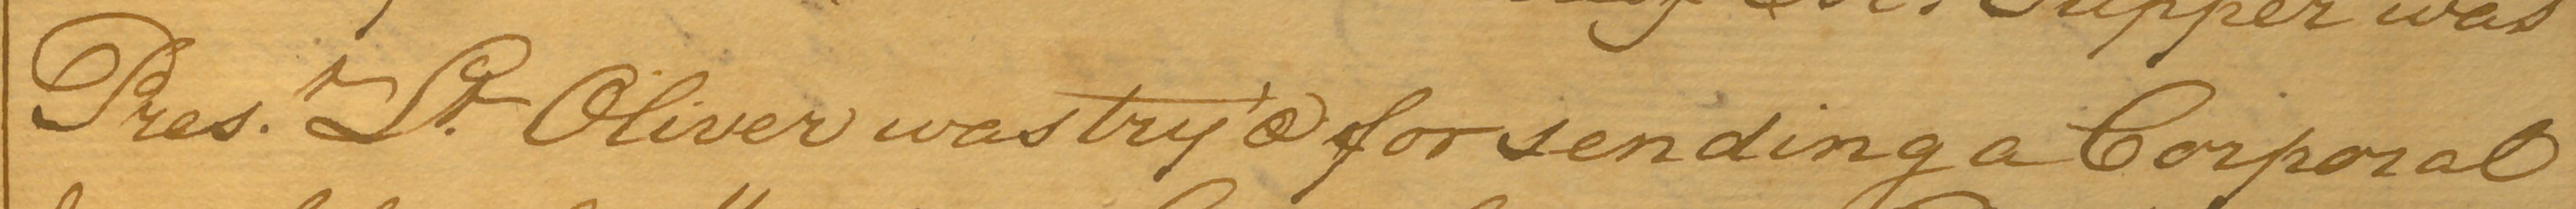Pres^t. L^t. Oliver was try'd for sending a Corporal
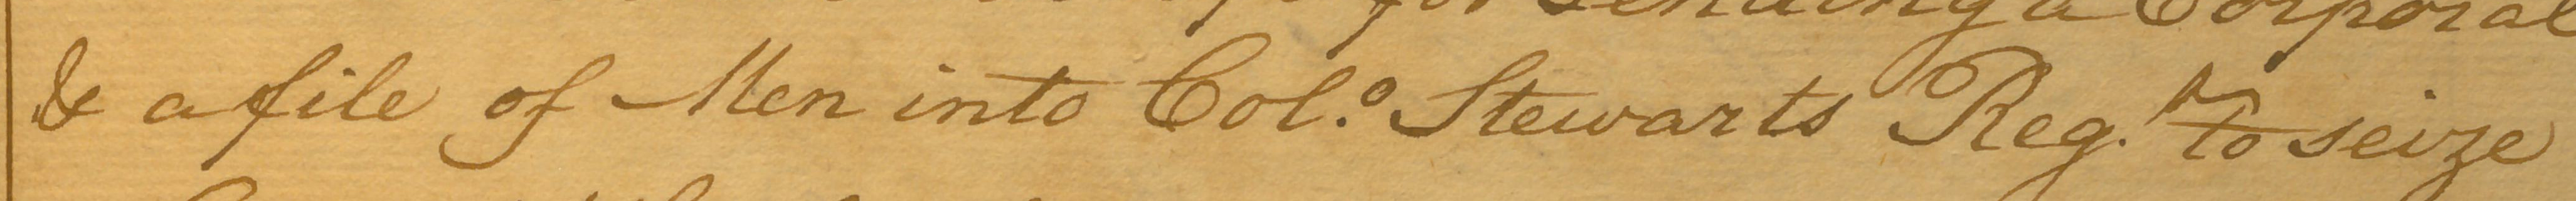& a file of Men into Col^o. Stewarts Reg^t. to seize
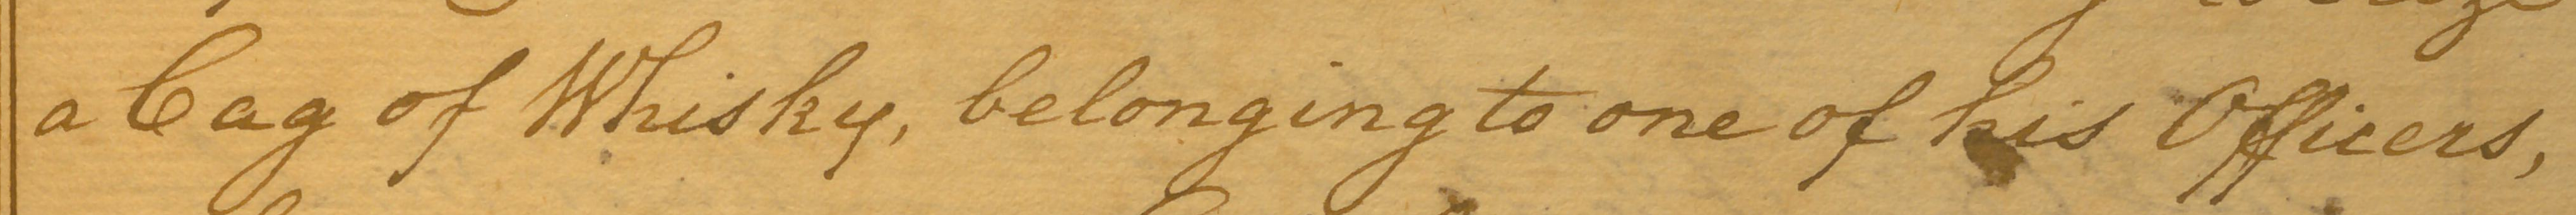a bag of Whisky, belonging to one of his Officers,
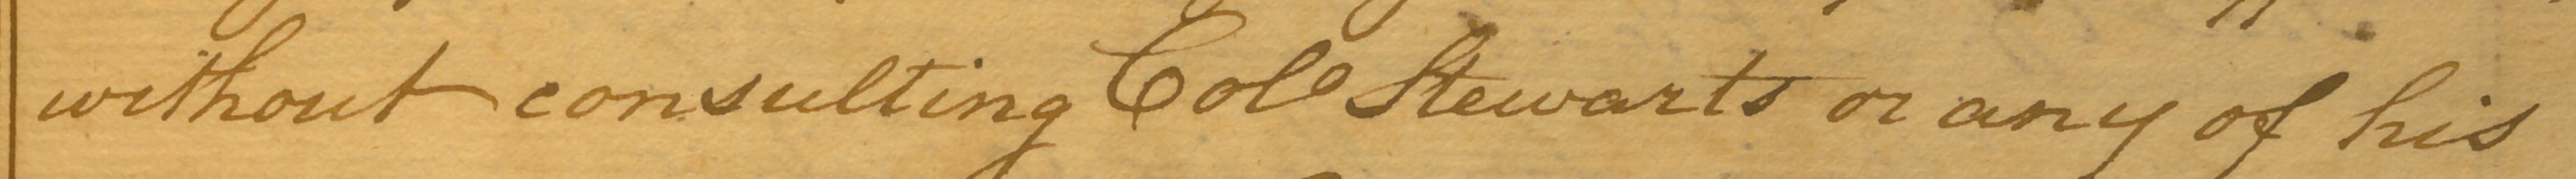without consulting Col^o Stewarts or any of his
